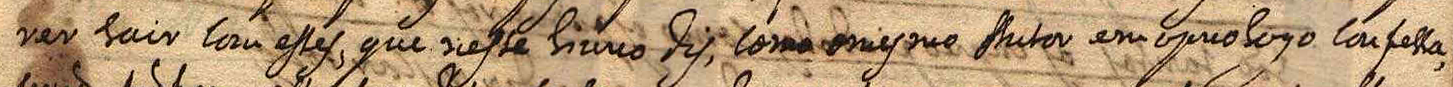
rer sair com estes, que neste liuro dis, como o mesmo Autor em o prologo confessa,
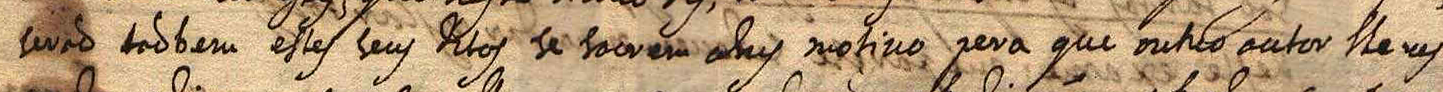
seraõ taõbem estes seus ditos se sairem a lus motiuo pera que outro autor lhe res
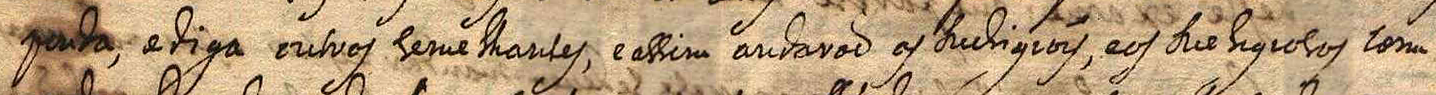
ponda, e diga outros semelhantes, e assim andaraõ as Religioĩs, e os Religiosos com
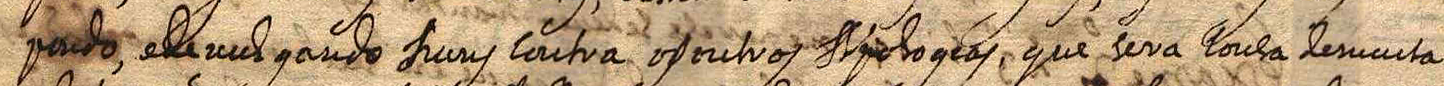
pondo, e diuulgando huns contra os outros Apologias, que sera cousa de muita
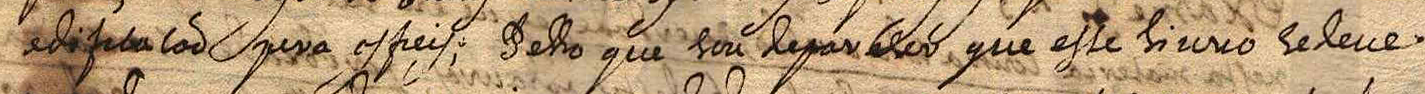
edificaçaõ pera os fieis; Pello que sou de parecer que este liuro se deue
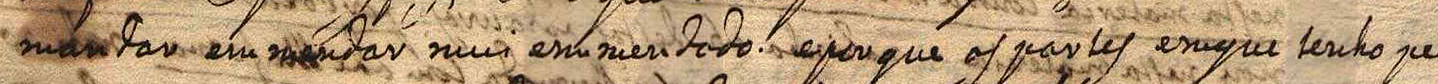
mandar emmendar mui emmendado. e porque as partes em que tenho pe
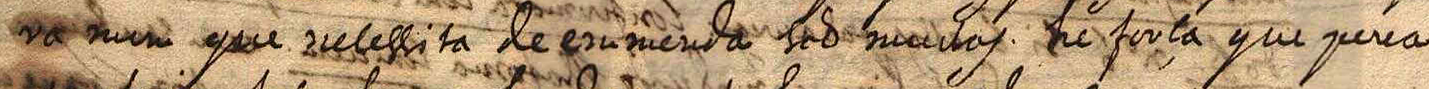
ra mim que necessita de emmenda saõ muitas he força que pera
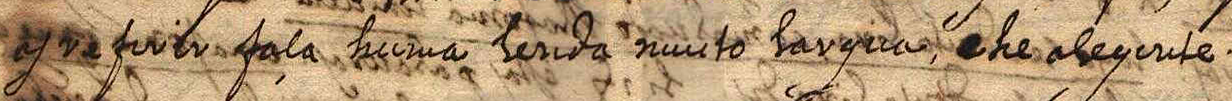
as referir faça huma lenda muito largua, e he a seginte.
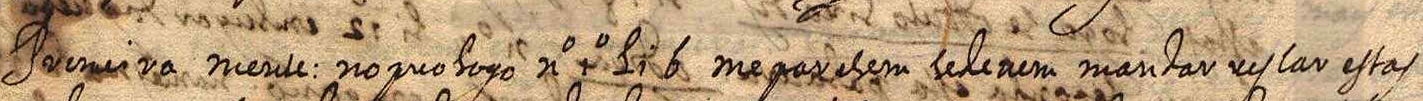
Primeiramente: no prologo no 1o li 6 me paresem se deuem mandar riscar estas
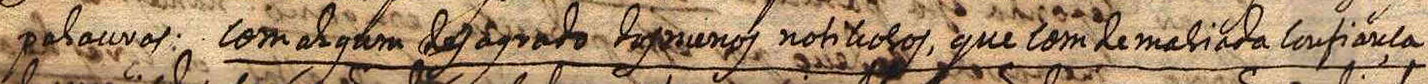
palauras: com algum desagrado dos menos noticiosos, que com demasiada confiança
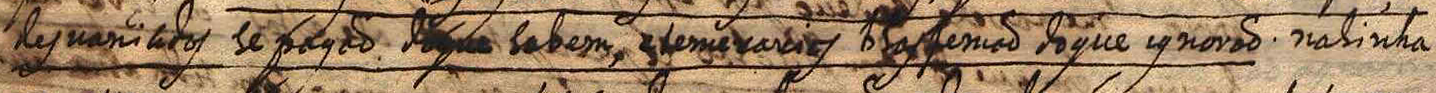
desuanicidos se pagaõ do que sabem, e temerarios blasfemaõ do que ignoraõ. na linha
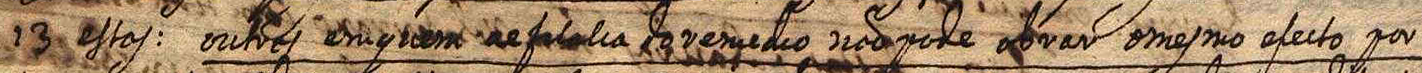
13 estas: outros em quem a eficacia do remedio naõ pode obrar o mesmo efecto por
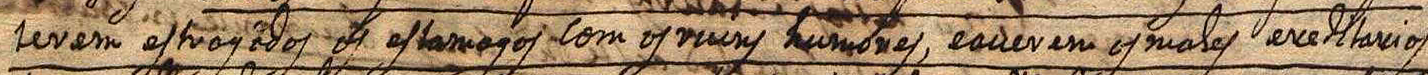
terem estragados os estamagos com os ruins humores, e auerem os males ereditarios
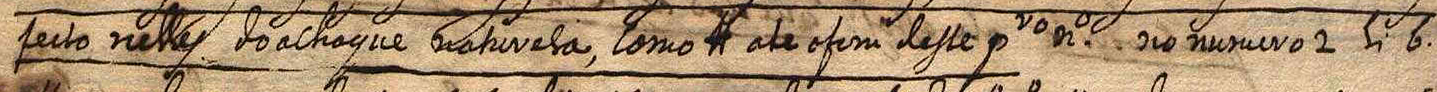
fecto nelles do achaque naturesa, como tt ate o fim deste pro no. no numero 2 li 6.
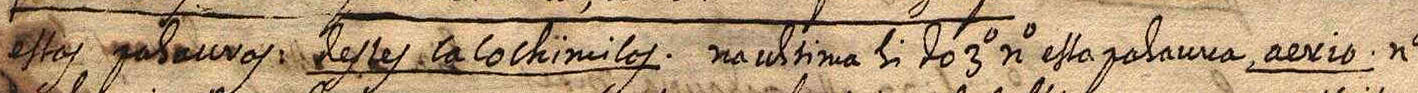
estas palauras. destes cacochimicos. na ultima li do 3o no esta palaura, aerio. no
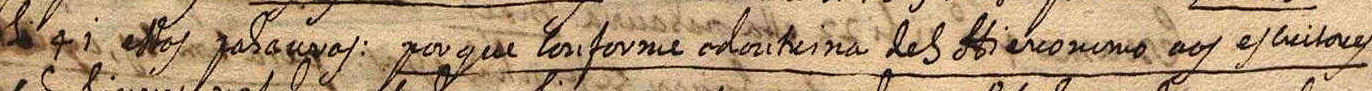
li 41 estas palauras: porque conforme a doutrina de S Hieronimo aos escritores
